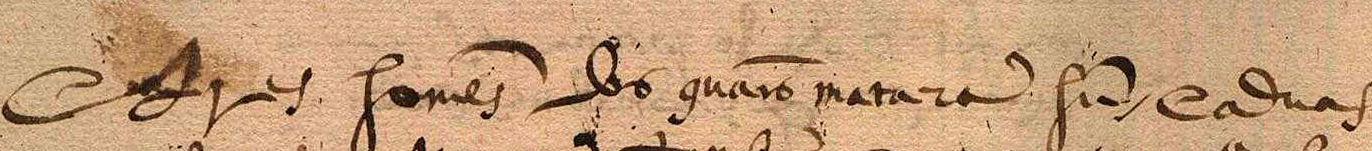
e tres homēs dos quāes matarā hū / e a duas
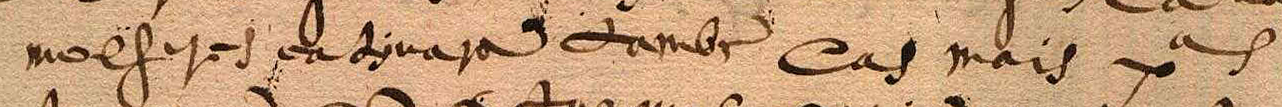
molheres catjuarā tambē e as mais pas
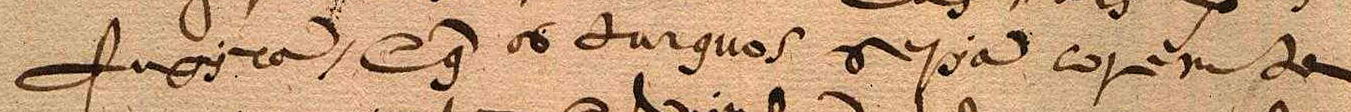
fugyrā / e q̅ os turquos serjā coremta
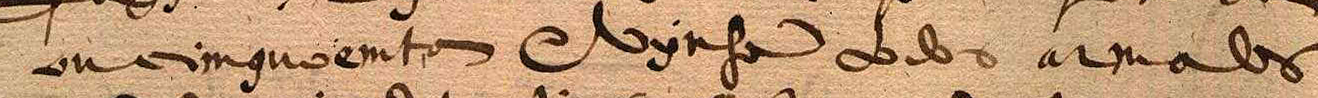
ou cimquoemta e vynhā todos armados
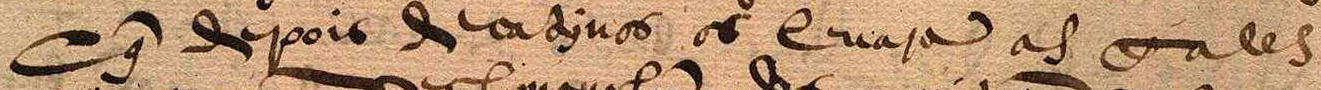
e q̅ depois de catyuos os leuarā as gales
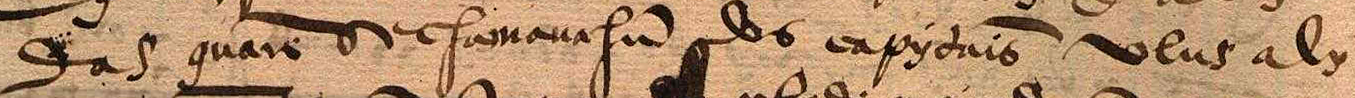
das quāes se chamaua hū dos capytāis vlus aly
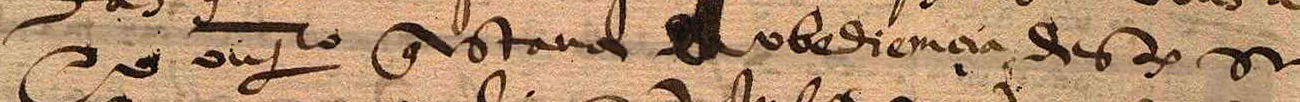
e o outro q̄ estaua _ obediemcia destꝭ se
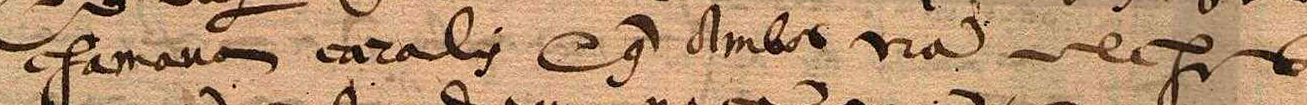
chamaua cazaly e q̄ Ambos erā elches
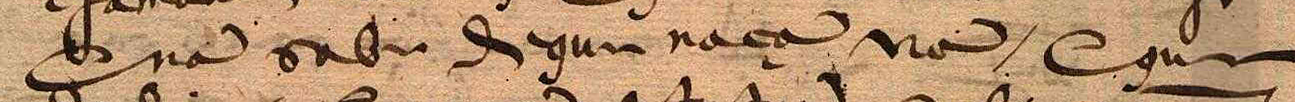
e nā sabe de que naçā erā / e que
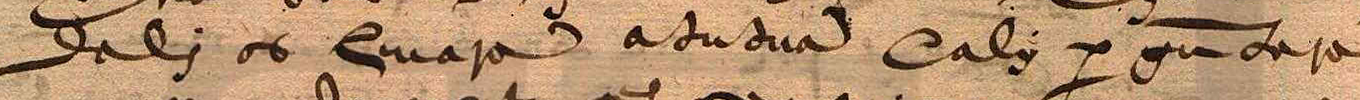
dalj os leuarā a tutuā e aly ꝑgūtarā
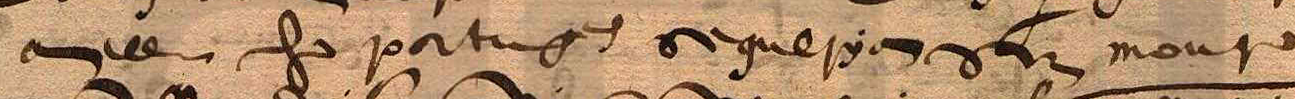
a elle djo portuges se querya ser mouro
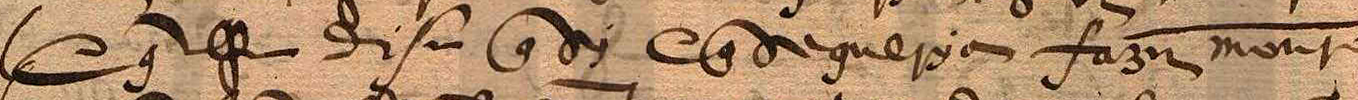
e q̅ lhe dise q̄ sy e q̄ se querya fazer mouro
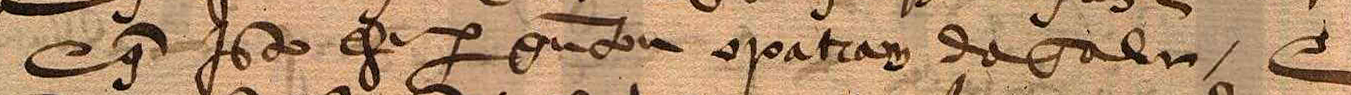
e q̅ Jsto lhe ꝑgu̅tou o patram da gale / e
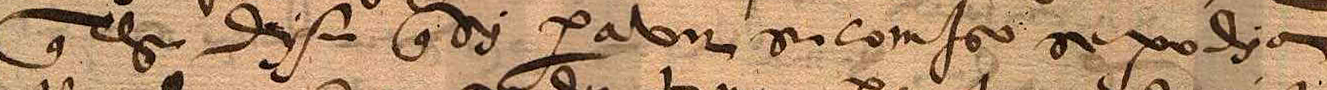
q̄ lhe dyse q̅ sy ꝑa ver se com Jso se podja
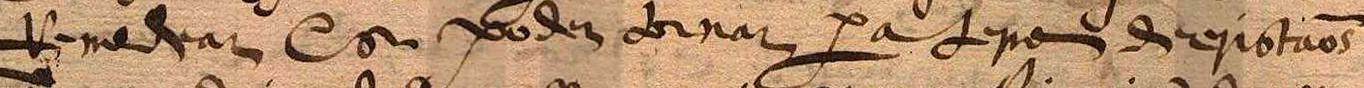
Remedear e se poder tornar ꝑa terra de cristaõs
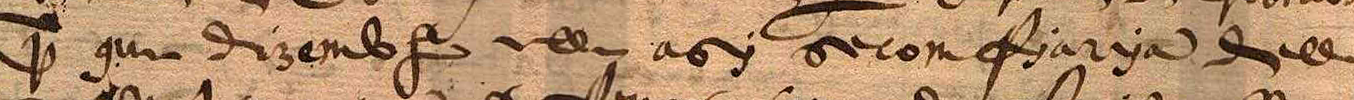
p̄o que dizendo ho elle asy se comfjaryā delle
